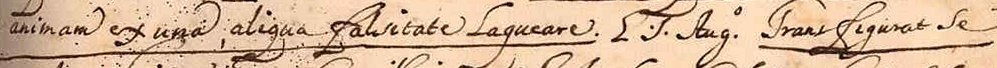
animam ex una, aliqua falsitate Laqueare. E S. Aug.o Transfigurat se
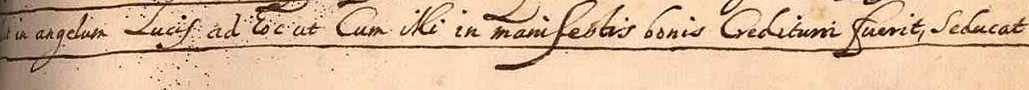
in angelum Lucis ad hoc ut Cum illi in manifestis bonis Creditum fuerit, Seducat
